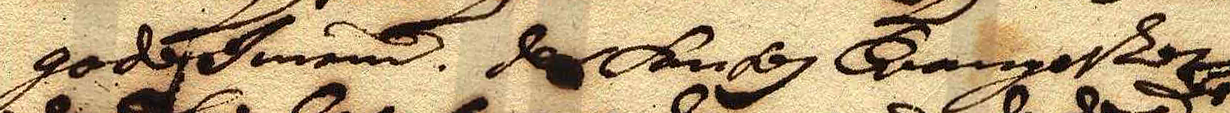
go do Iuram.to dos Santos Evangelhos
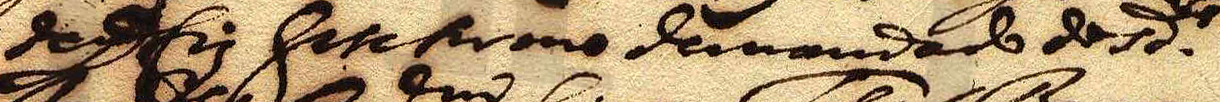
de q̄ fiz este termo de mandado dos d̄.os
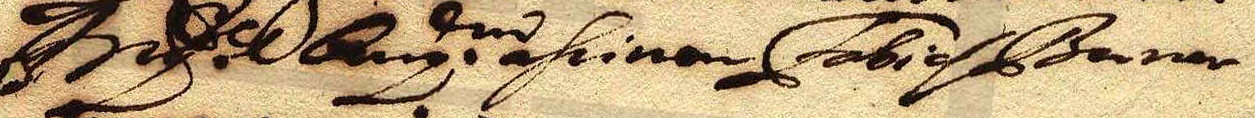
Jnq.res Com q.em assinou Fabiaꝭ Bernar
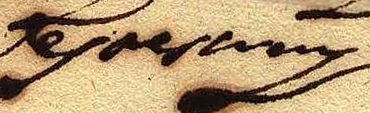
des o escreuj
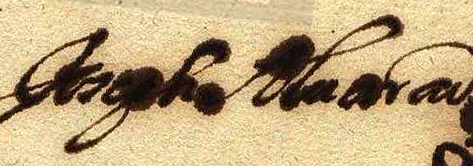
Joseph Alvarado
